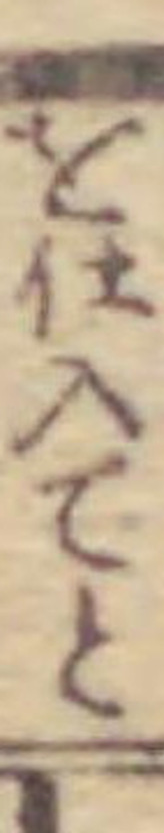を仕入てと
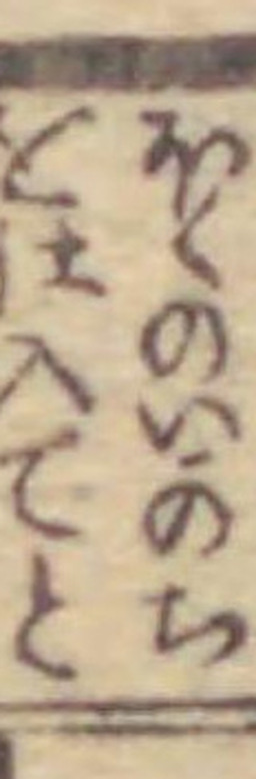を仕入てと
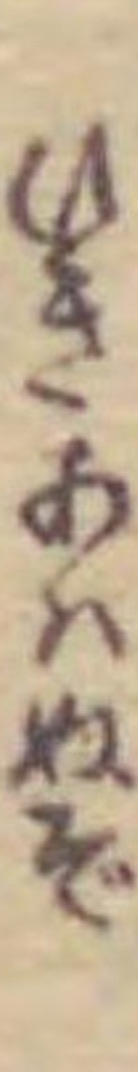ひきあはぬぞ
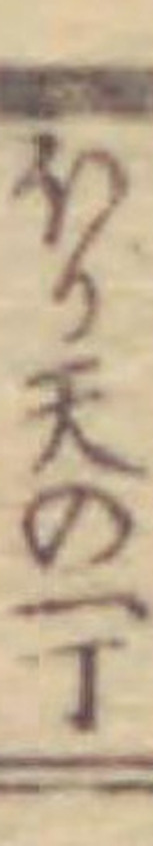ほり天の一丁
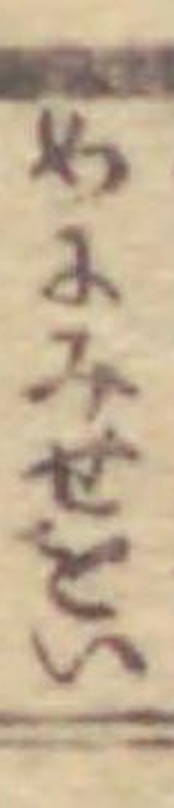めにみせをい
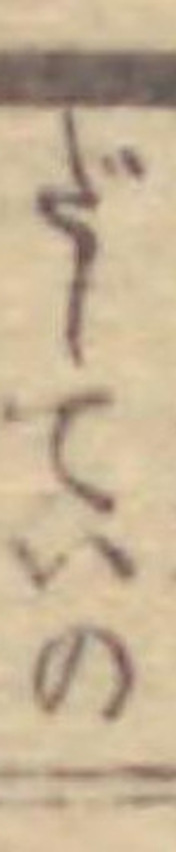だしていの
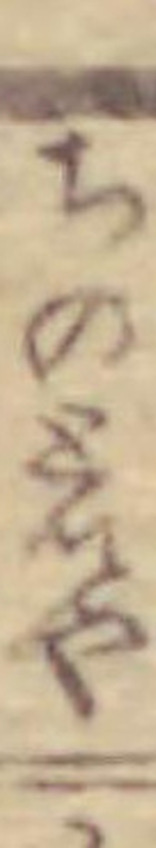ちのといや
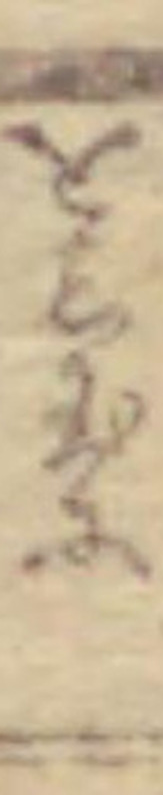をし玉ふ
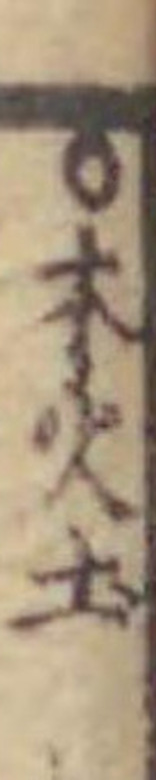○木火土
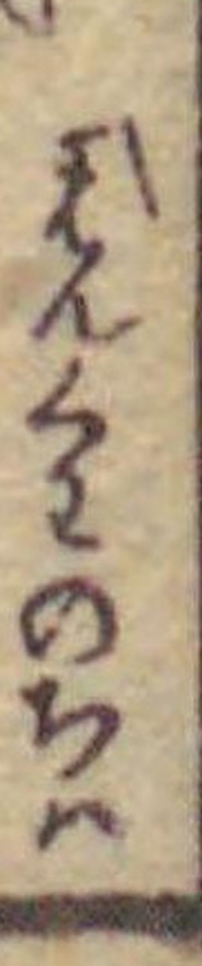〽はんくわのちは
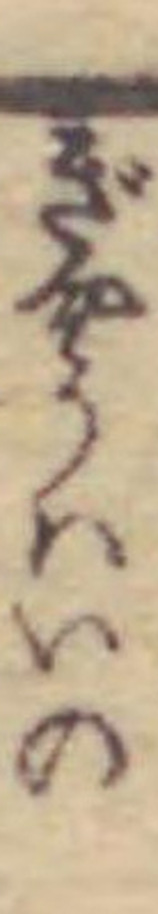ぎやうはいの
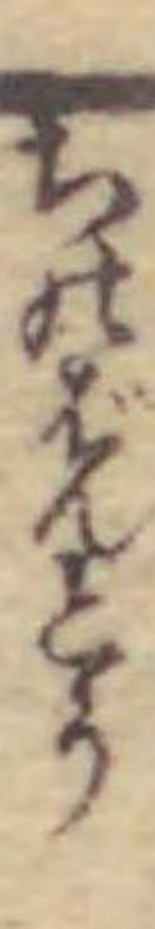ちのばんとう
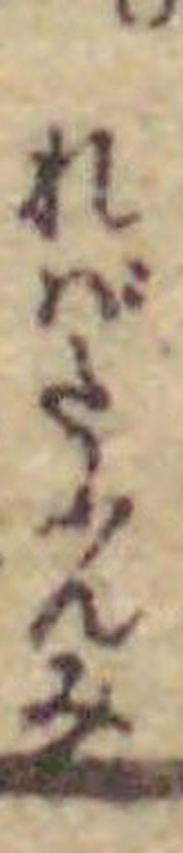ればたふんみ
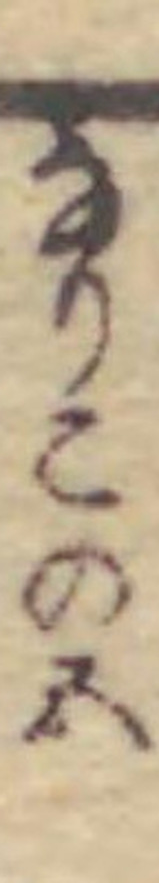なりこの五
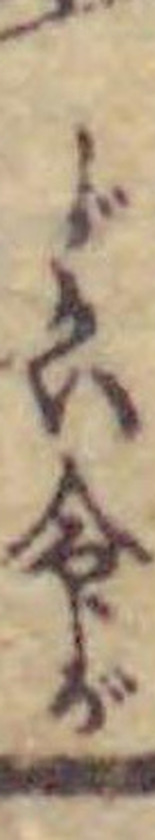じかい命が
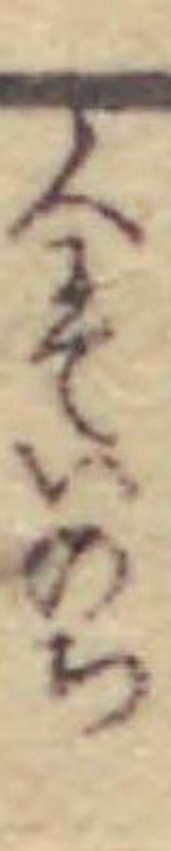人にていのち
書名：御誂染長寿小紋 : 3巻
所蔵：国立国会図書館 National Diet Library, JAPAN
